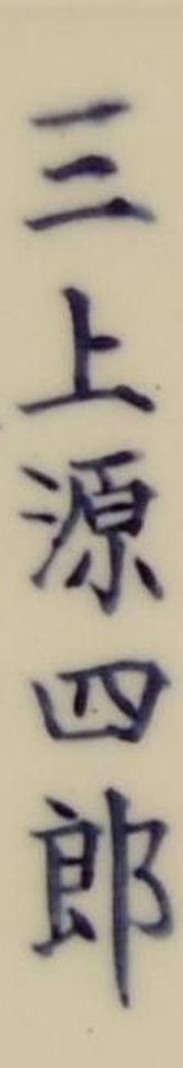三上源四郎
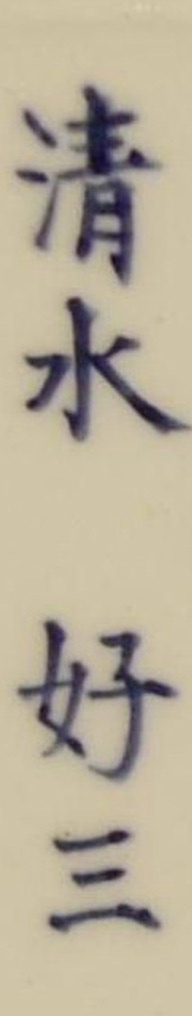清水好三
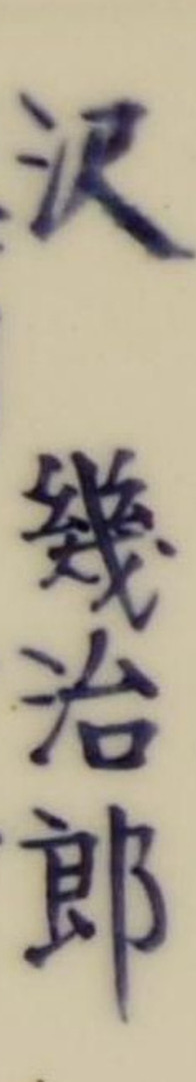沢幾治郎
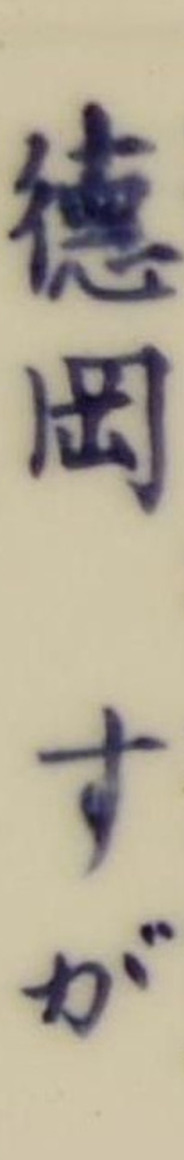徳岡すが
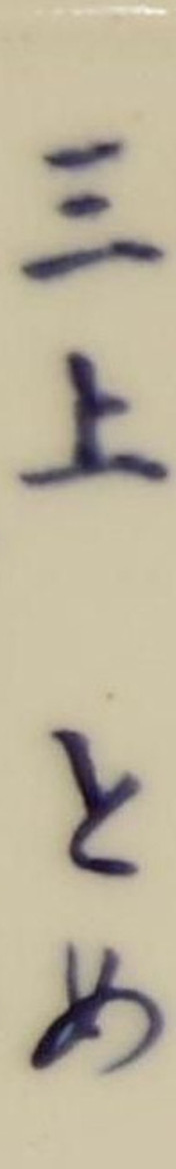三上とめ
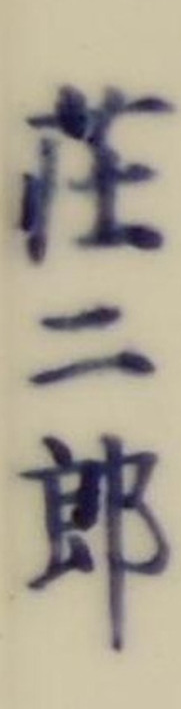荘二郎

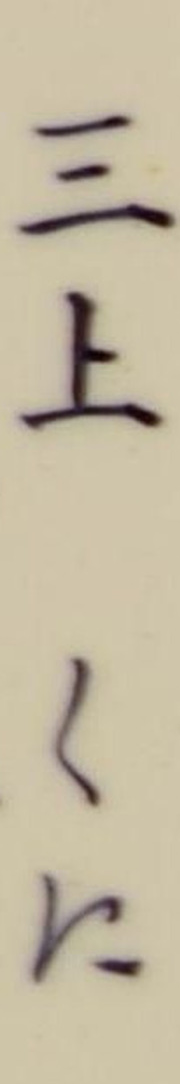三上くに
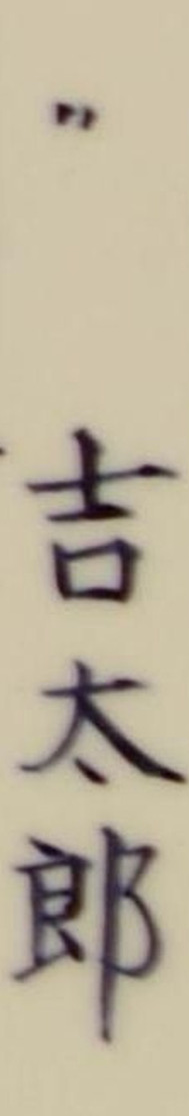吉太郎
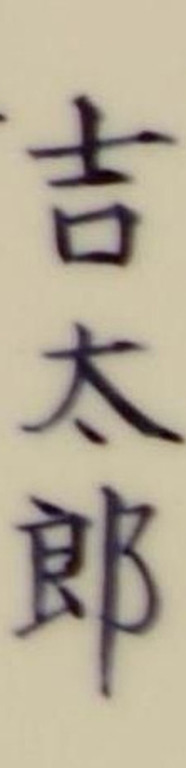吉太郎
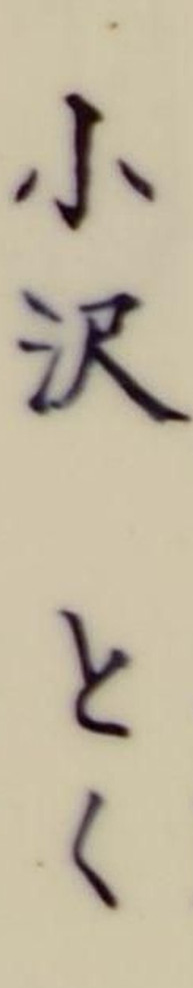小沢とく
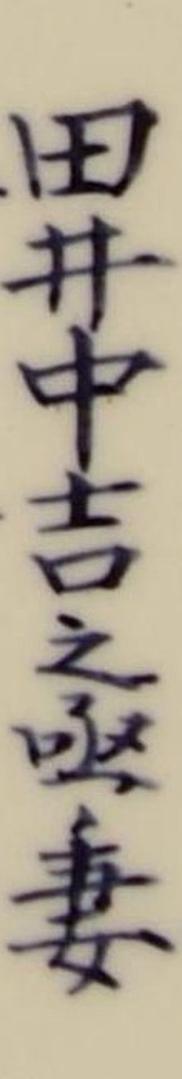田井中吉之丞妻
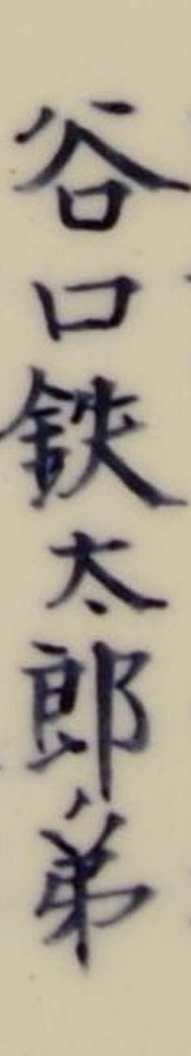谷口鉄太郎弟
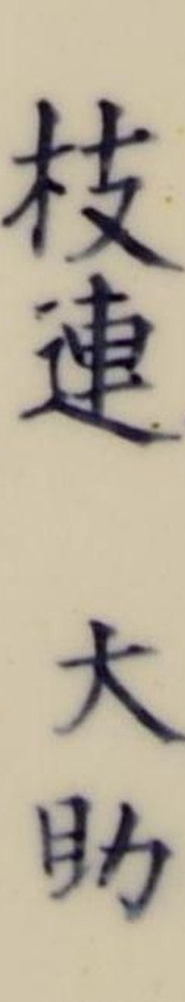枝連大助
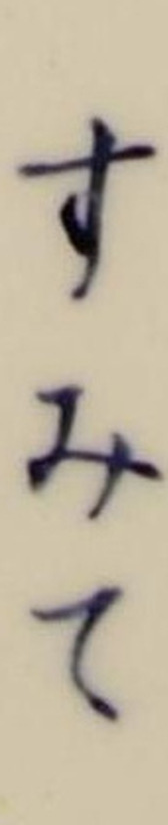すみて
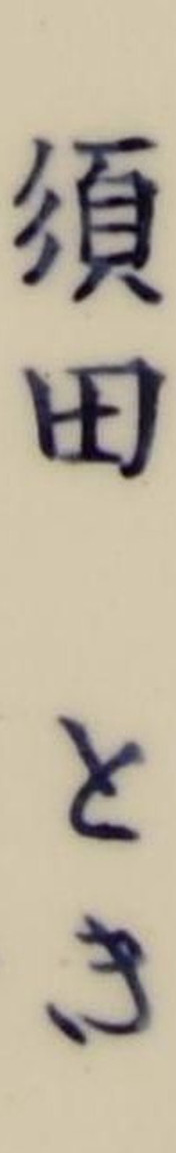須田とき
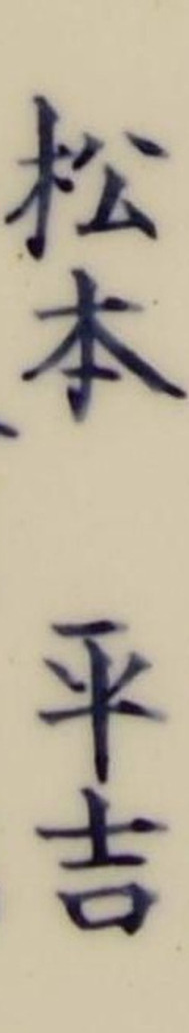松本平吉
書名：E~L
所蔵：高野山金剛峯寺
